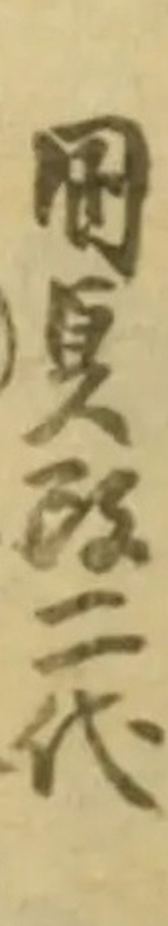國貞改二代
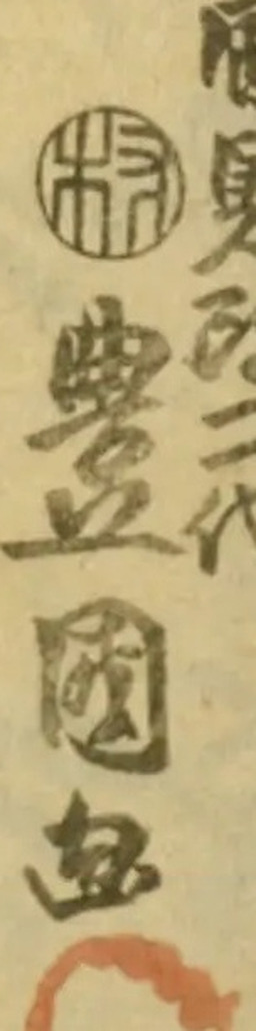豊國画
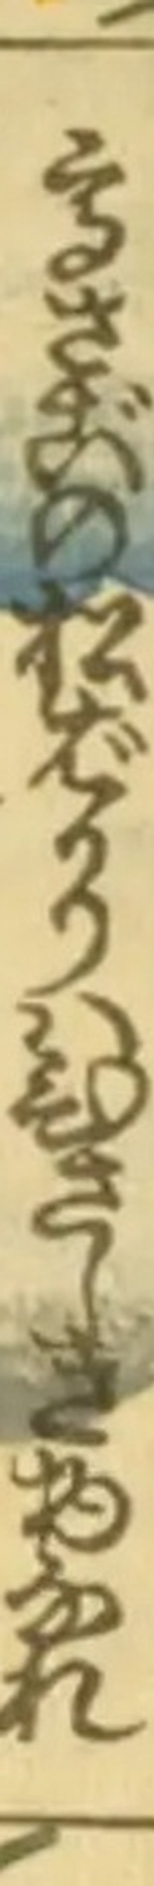高さごの松ばかりはひさしきものなれ
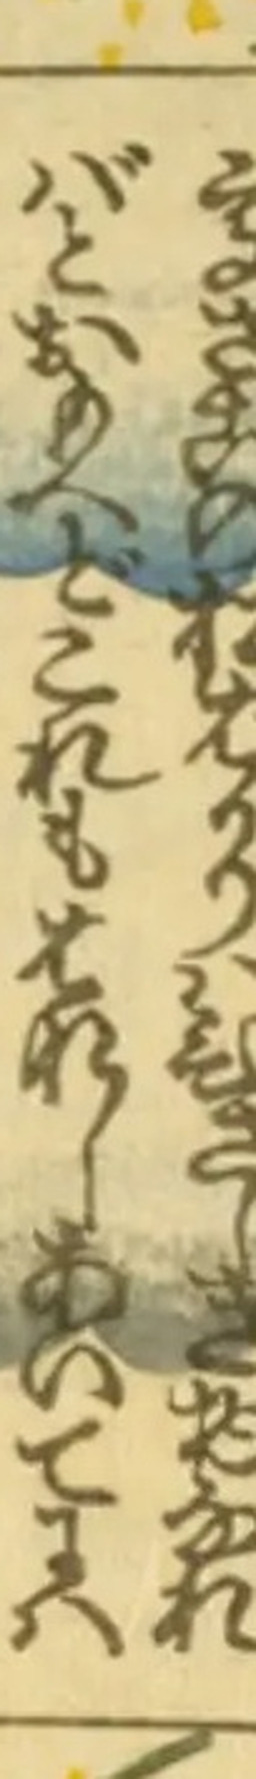バとおもへどこれもはなしあいてには
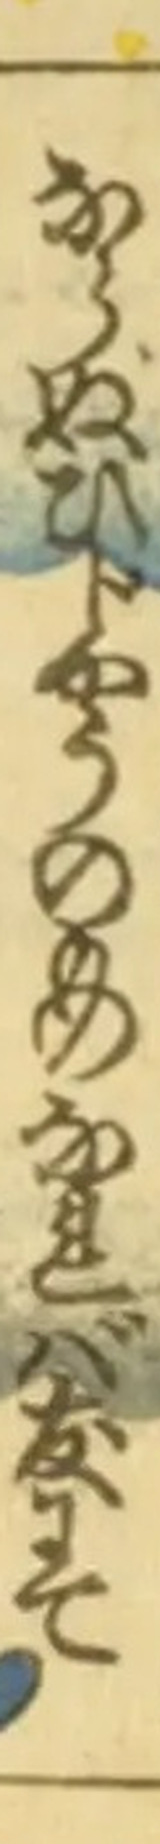ならぬひとやうのものなれば友にて
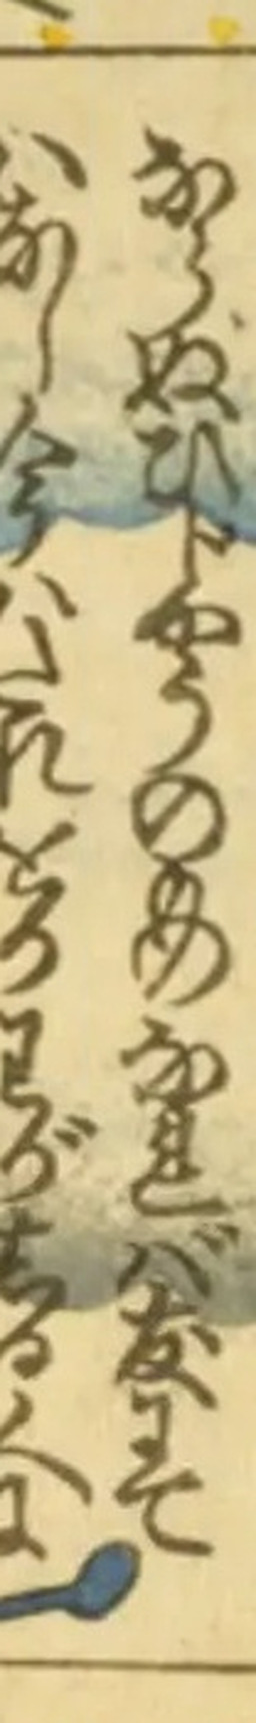はなし今はたれをかわがしる人に
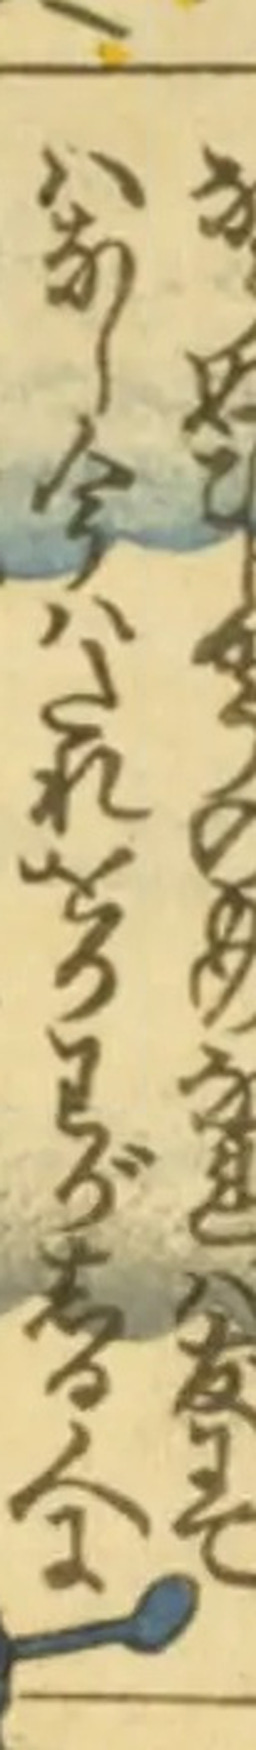はなし今はたれをかわがしる人に
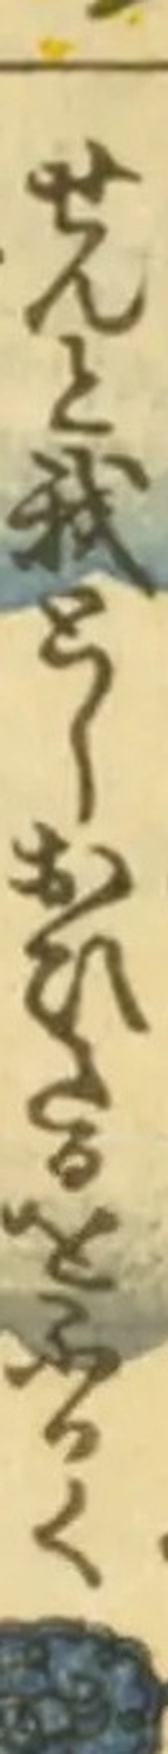せんと我としおひたるをふかく
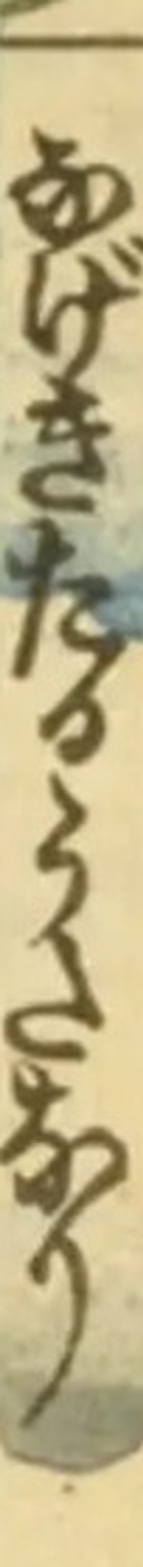なげきたるうたなり
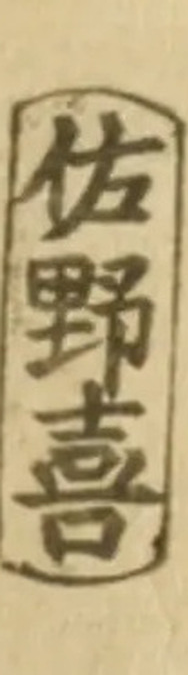佐野喜
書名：百人一首絵抄　卅三　藤原興風
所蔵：国立国会図書館 National Diet Library, JAPAN
